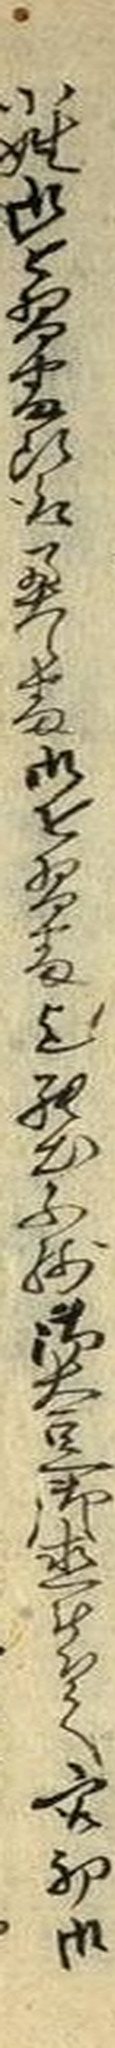小姓御近習番頭取奥之番御近習番迄罷出不残御大豆御直被下之最初御
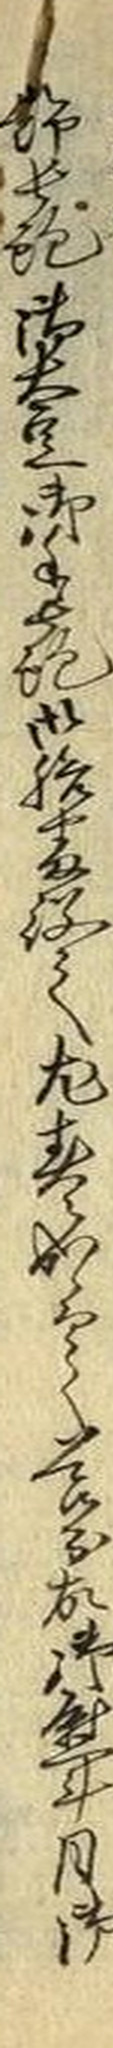飾長鮑御大豆御手長鮑御膳番役之尤春ニ成候而之節分故御熨斗目御
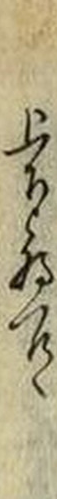上下被為召候
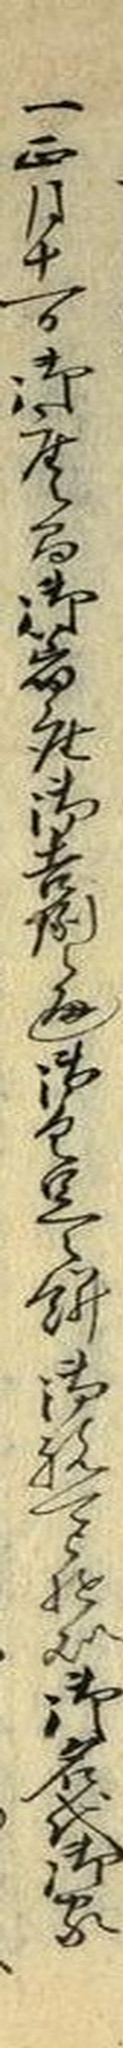一正月十一日御座之間御着座御吉例之通御具足之餅御祝可被遊候処御名代御家
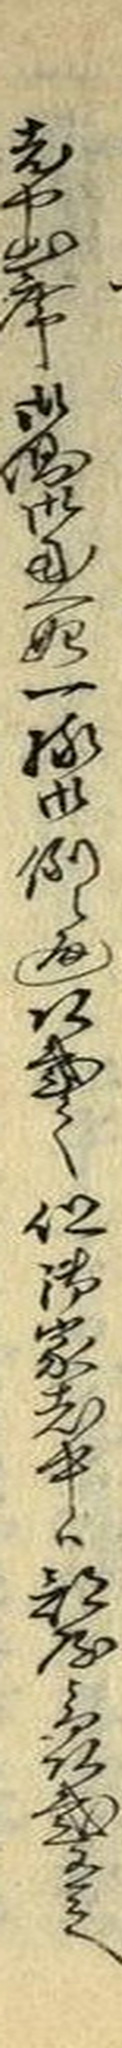老中出席御側御用人始一統御例之通頂戴之但御家老中ハ部屋ニ而頂戴有之
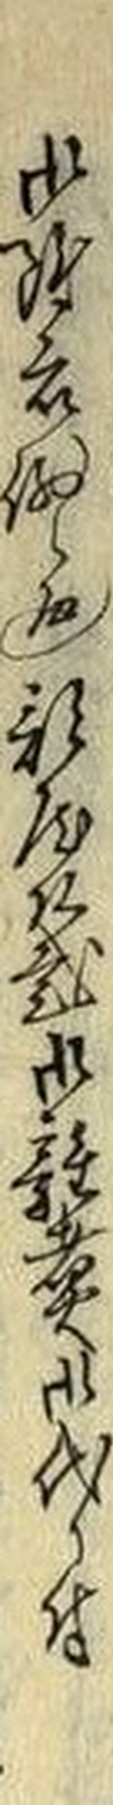御附衆例之通部屋頂戴御雑煮御代り付
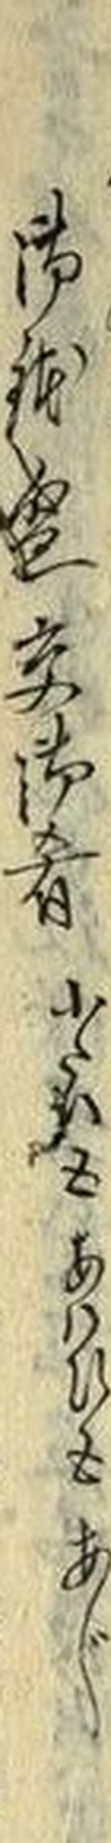御鉢盛交御肴小たい五あハひ五あじ
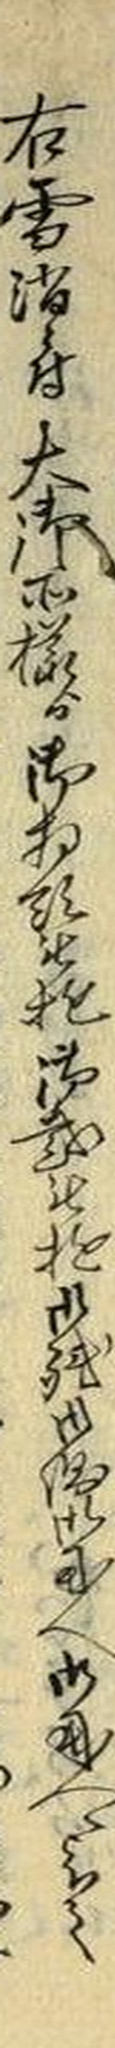右雪消ニ付大御所様ゟ御拝領被遊御戴被遊御残御側御用人御用人へ被下之
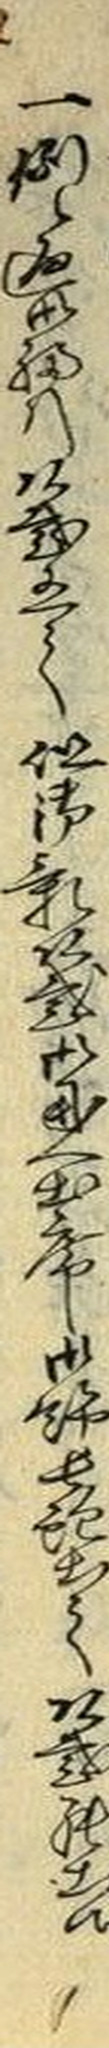一例之通御福引頂戴有之但御影頂戴御用人出席御飾長鮑出之頂戴罷出候
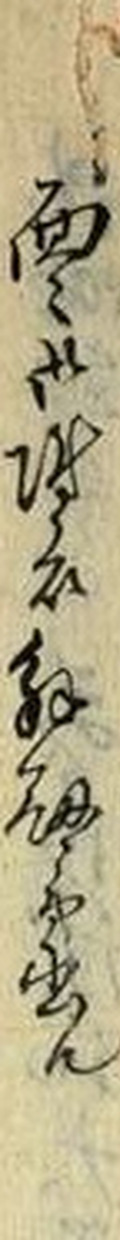面々御附衆解剣ニ而出ル
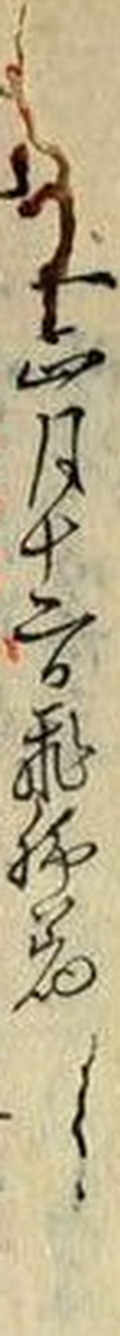一正月十二日飛脚着
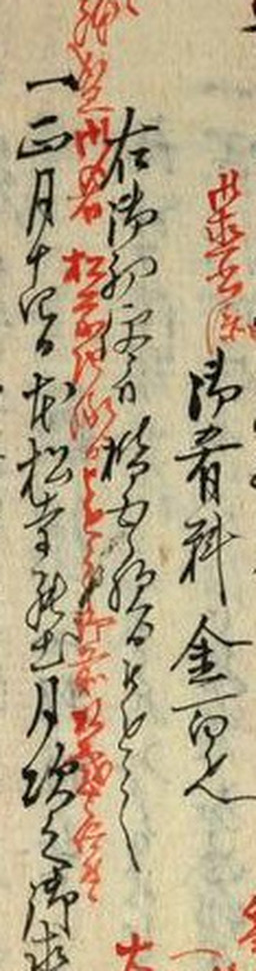右御初便ニ付楷五様ゟ被進之
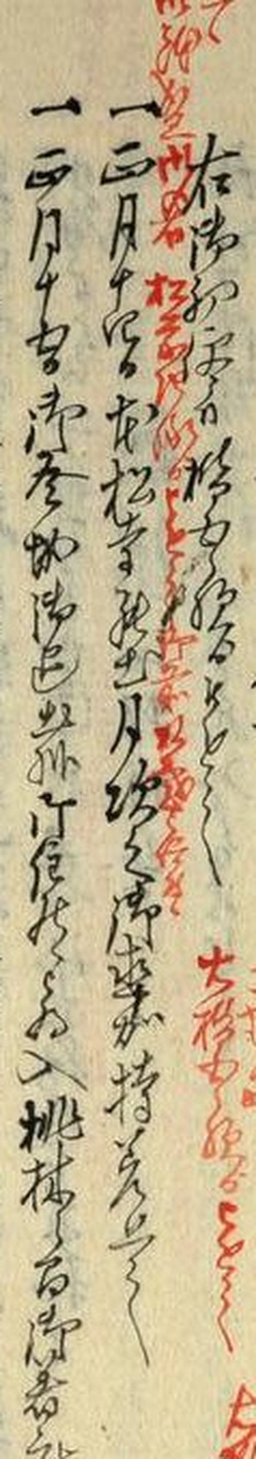一正月十四日本松寺罷出月次之御直加持差上之
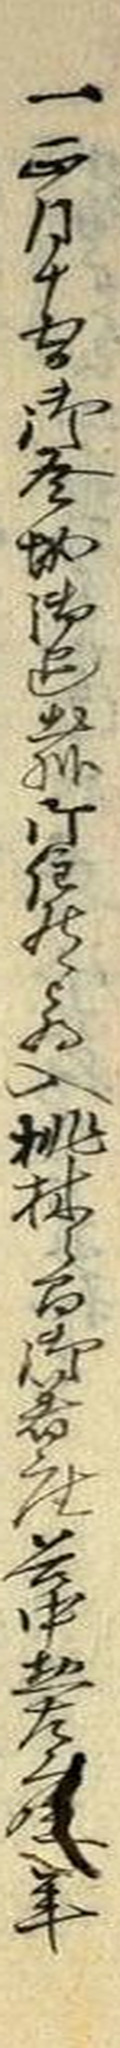一正月十五日御登城御退出掛御住居へ被為入桃林之間御着座谷中惣左衛門殿年
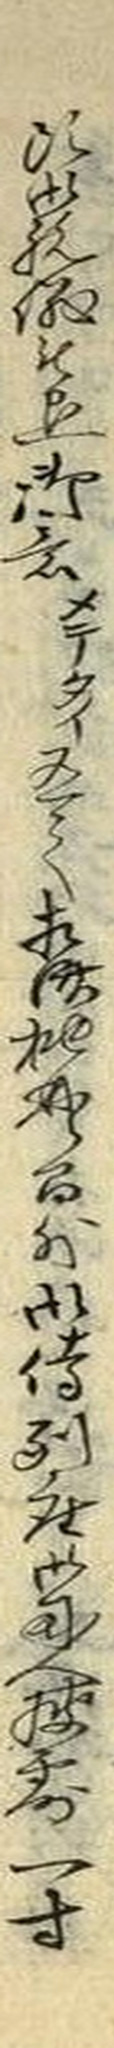頭御祝儀被申上御意メテタイ有之相済桃林之間外御侍列座御用人披露一寸
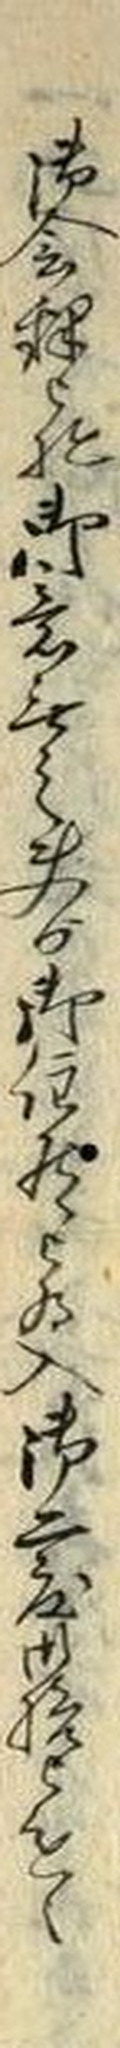御会釈被遊御意無之夫ゟ御住居被為入御二度御膳被進之
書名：少傅日録抄（斉善付側向頭取日記、江戸并道中、初入在国、逝去後…
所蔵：福井県文書館 Fukui Prefectural Archives
